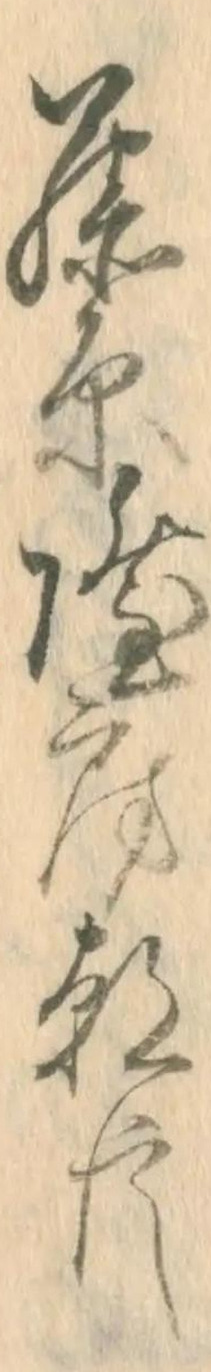藤原隆房朝臣
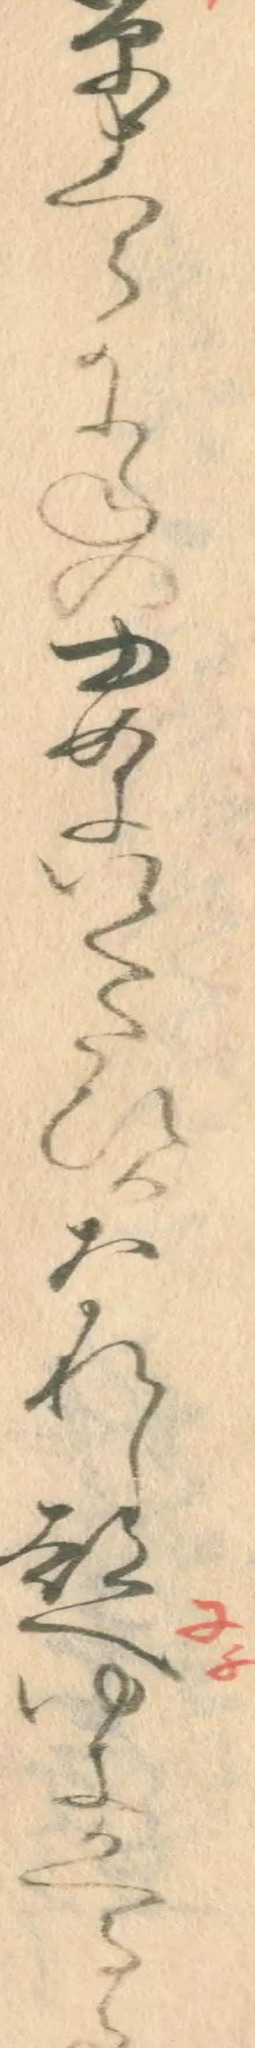草まくらかりねのゆめにいくたひかなれし都へゆきかへるらむ
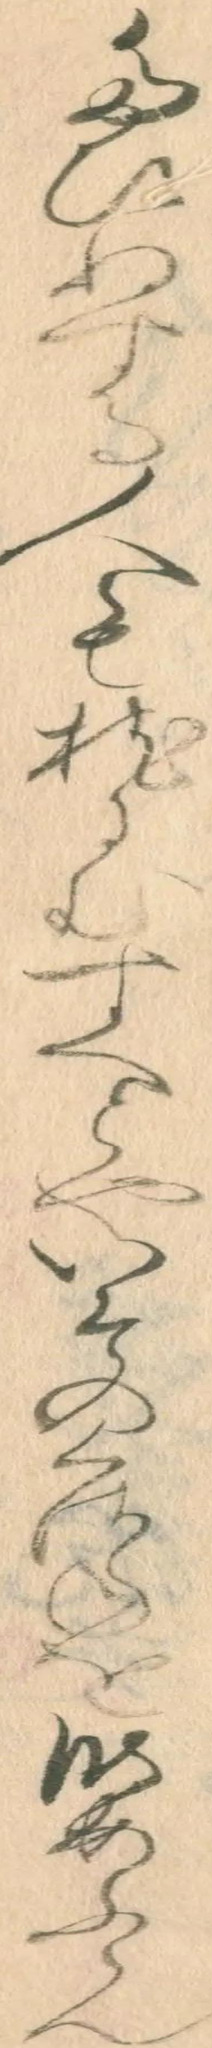たひねする人も枕にむすへとやいそのくさねを波あらふらん
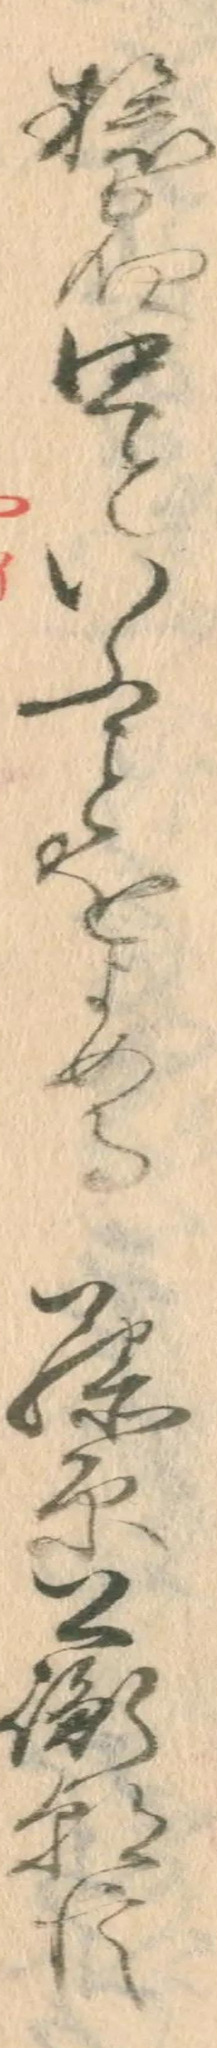旅宿虫といふことをよめる藤原公衡朝臣
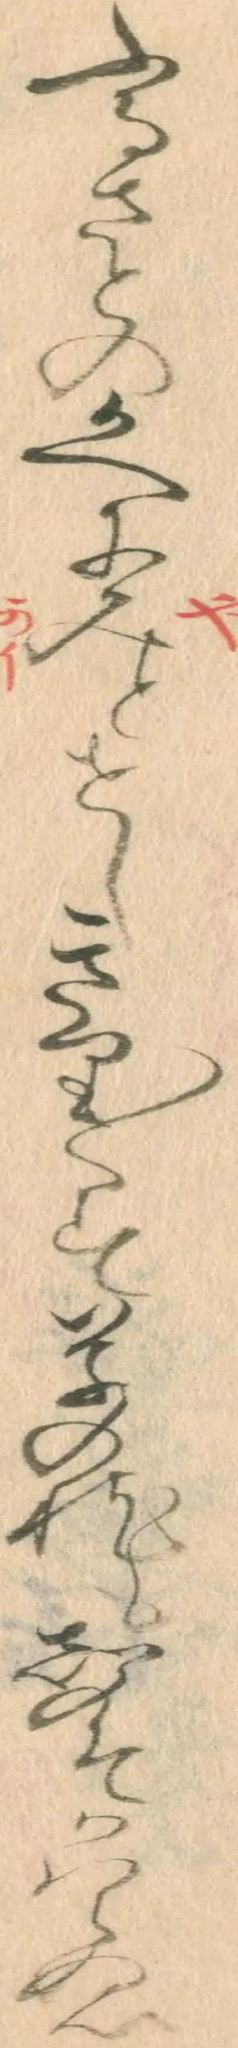ふるさとのかへにみとせしきり〳〵す草の枕も聞そかはらぬ
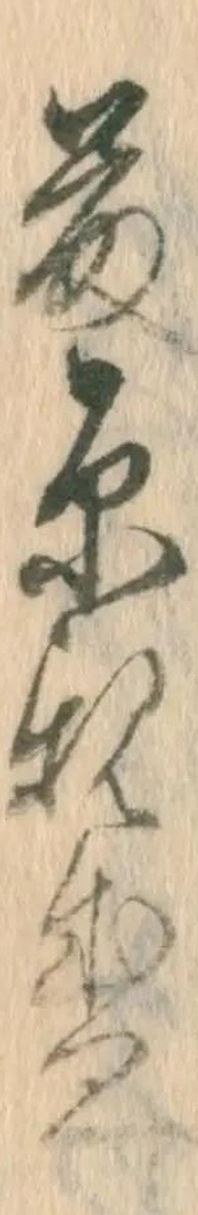藤原親盛
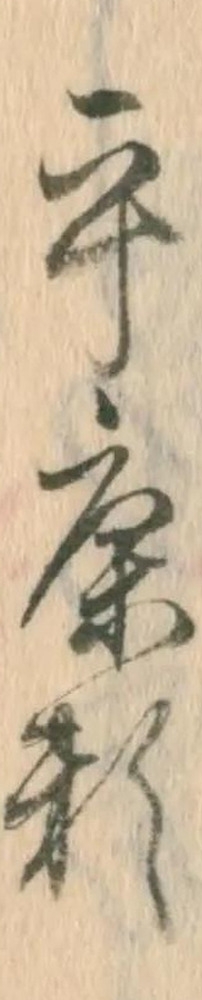平安頼
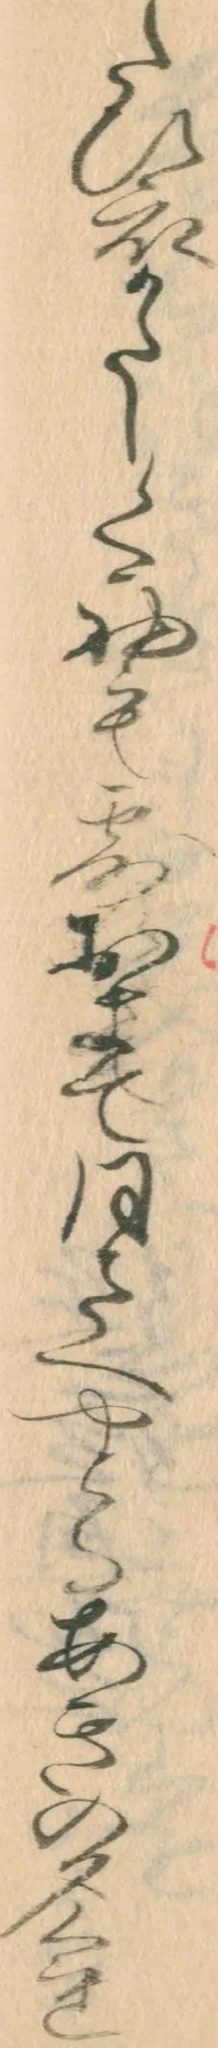たひ衣かたしく袖も露おきて月さへやとるあきの夕くれ
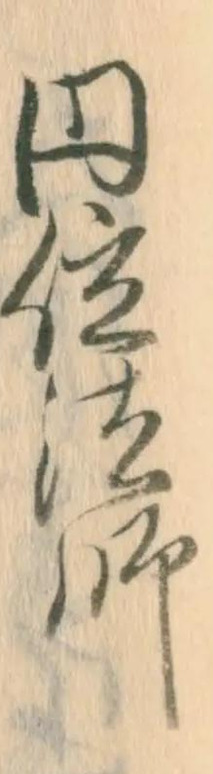円位法師
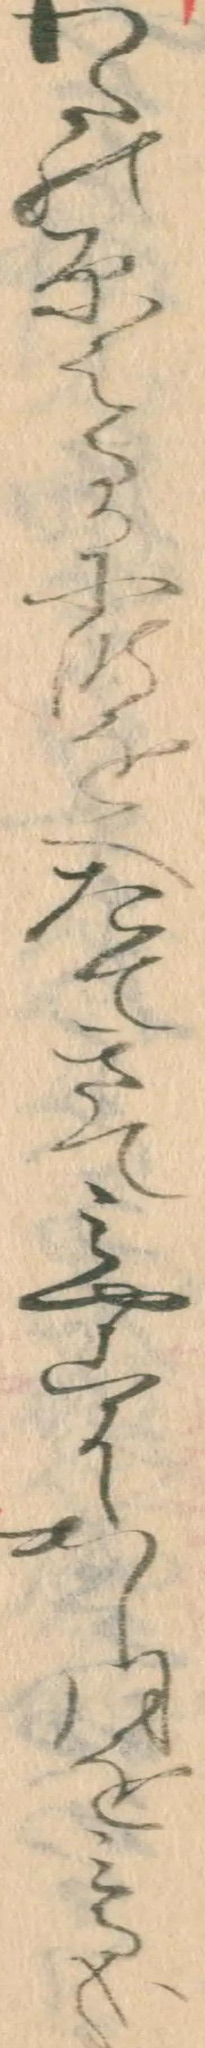わたの原はるかに波をへたてきてみやこに出し月をみる哉
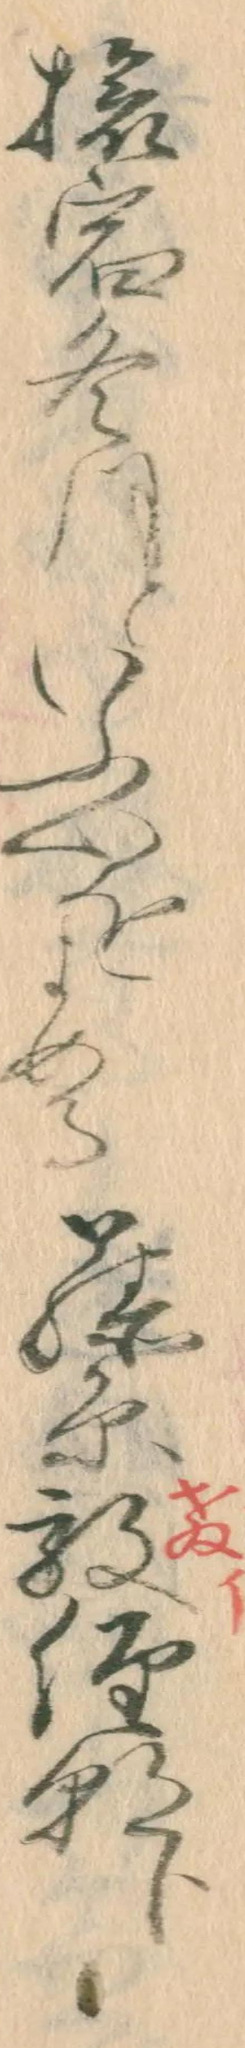旅宿冬月といふ心をよめる藤原敦経朝臣
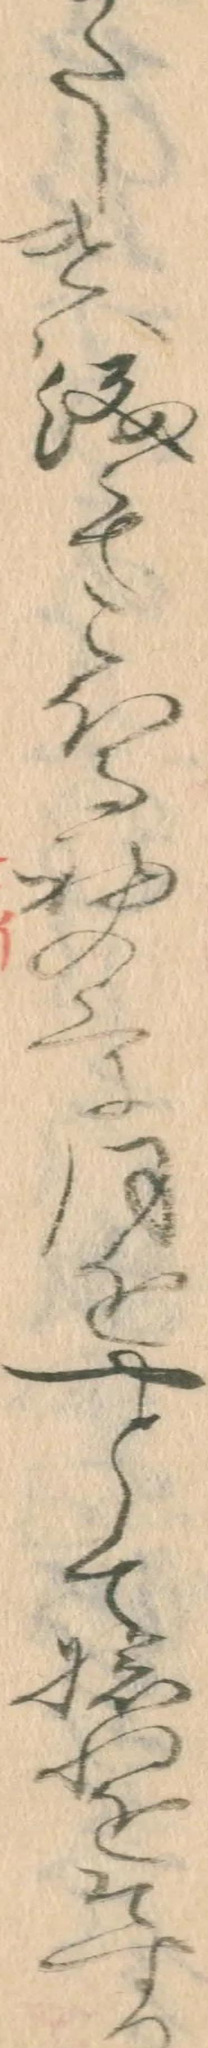かたしけは涙もこほる袖の上に月をやとして旅ねをそする
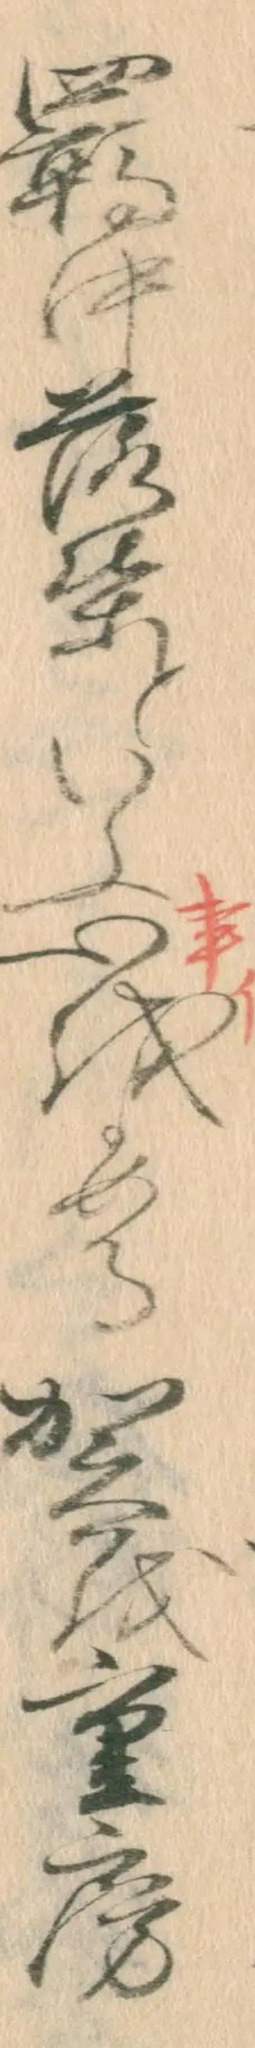覊中落葉といふ心をよめる賀茂重房
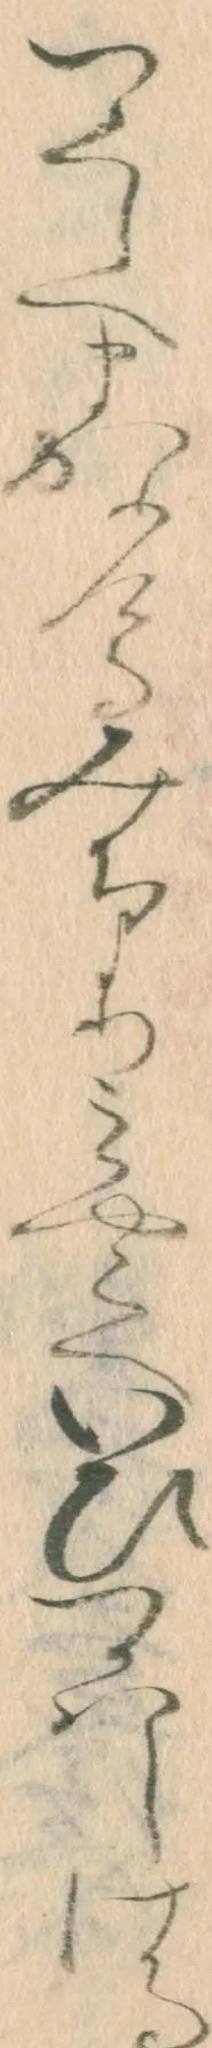つくしへまかりけるみちよりみやこへいひつかはしける
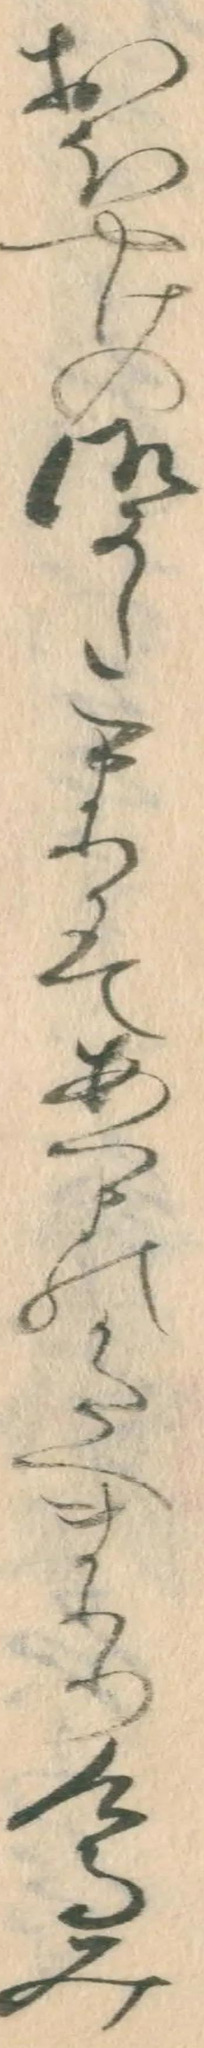おほやけの御かしこまりにてあつまのかたへまかりけるみ
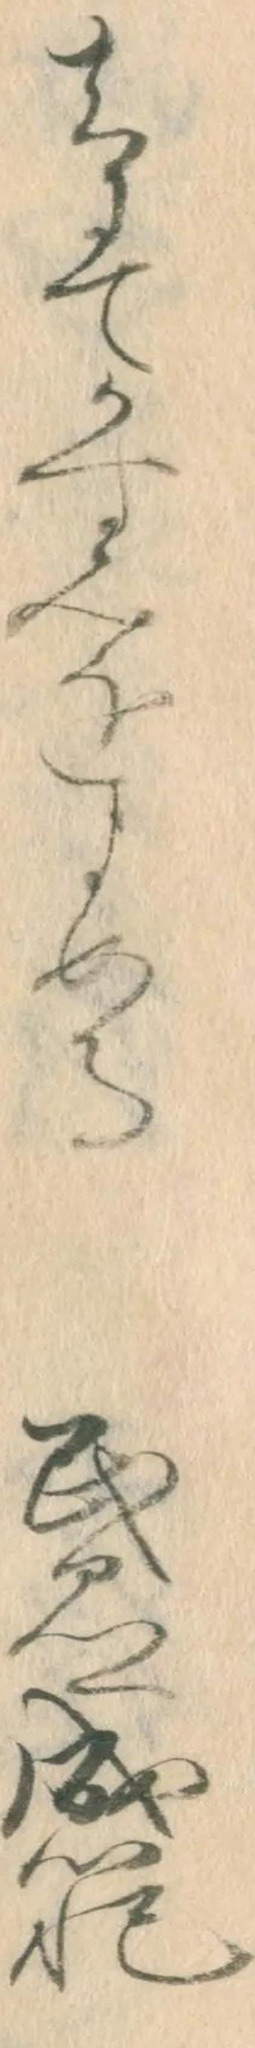ちにてかすみをよめる民部卿成範
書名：月詣和歌集
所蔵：国立国会図書館 National Diet Library, JAPAN
